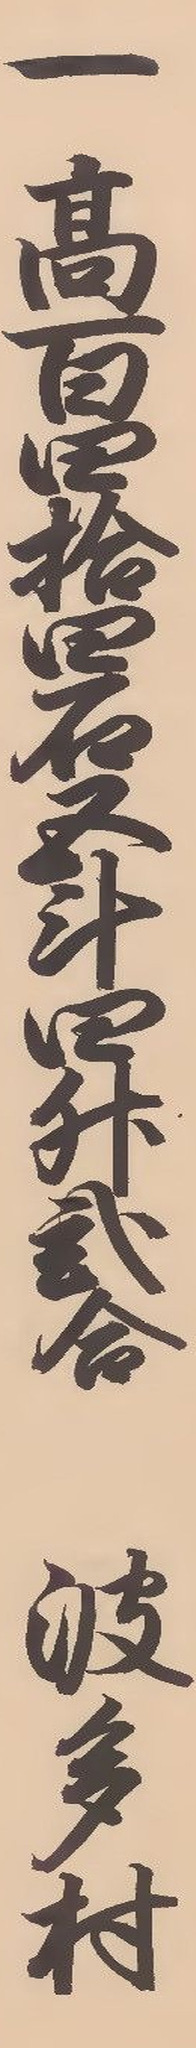一高百四拾四石五斗四升弐合波多村
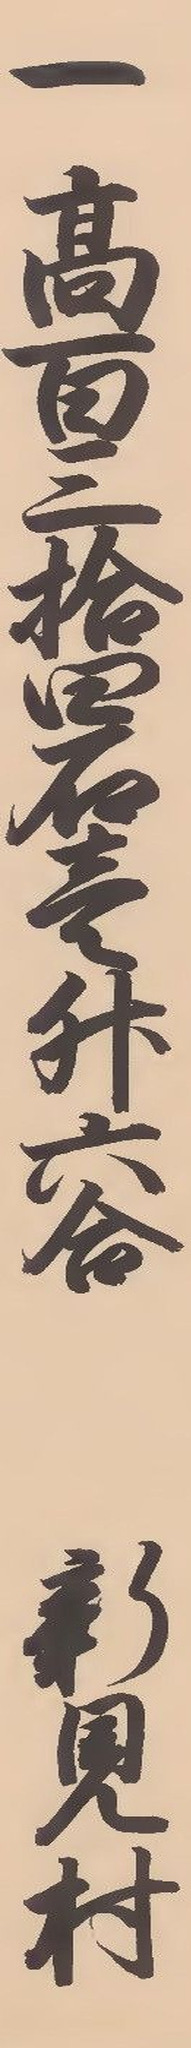一高百三拾四石壱升六合新見村
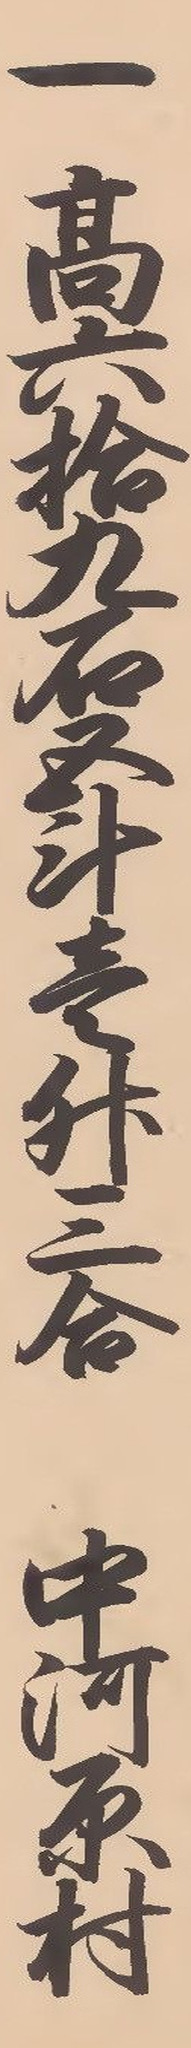一高六拾九石五斗壱升三合中河原村
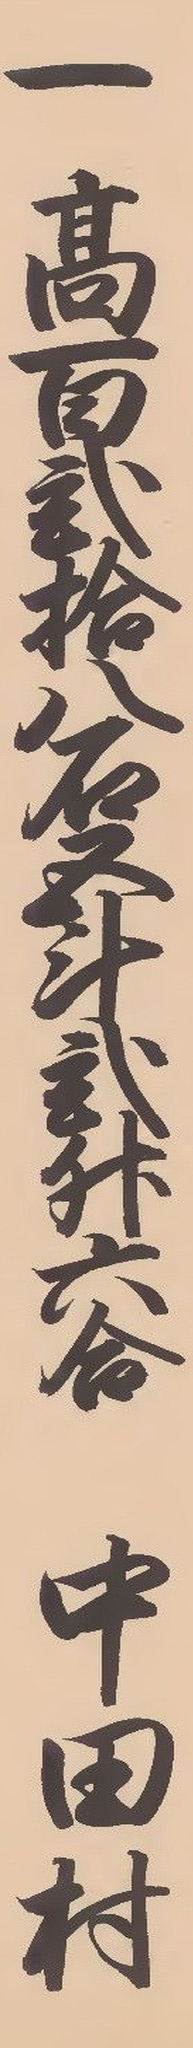一高百弐拾八石五斗弐升六合中田村
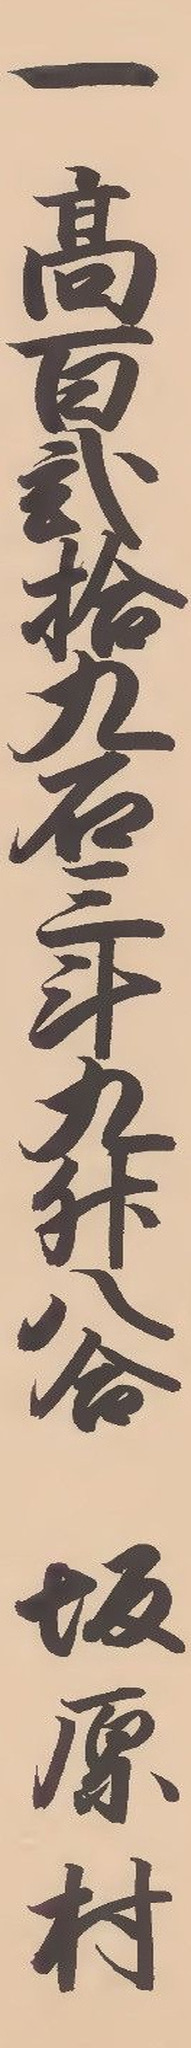一高百弐拾九石三斗九升八合坂原村
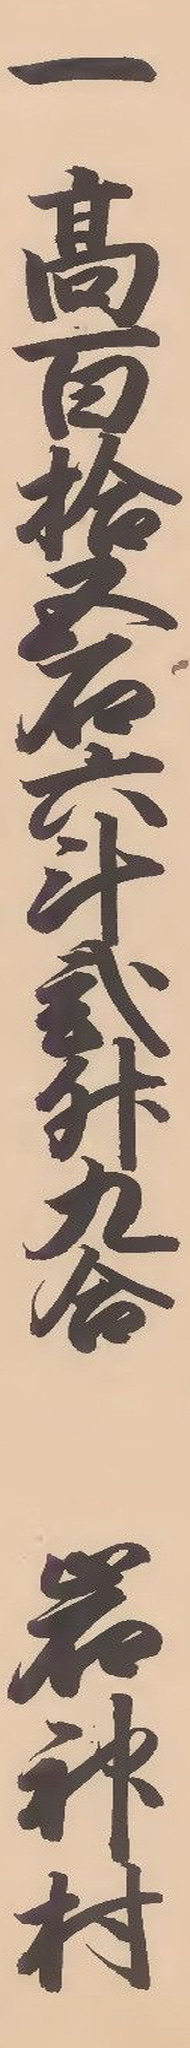一高百拾五石六斗弐升九合岩神村

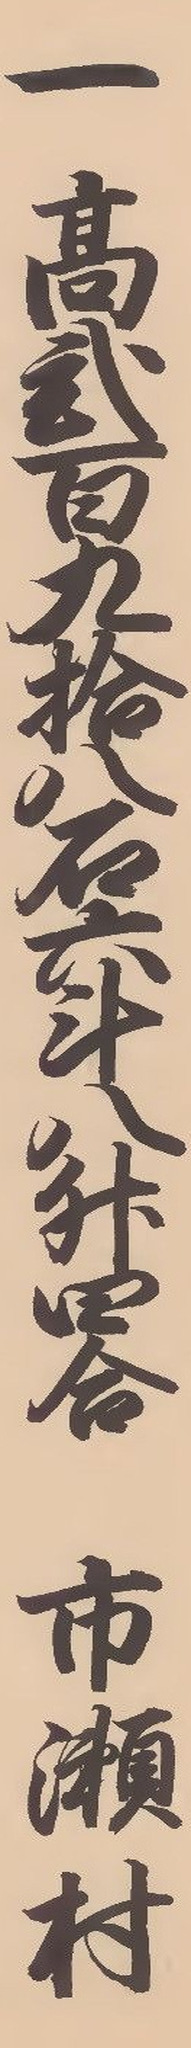一高弐百九拾八石六斗八升四合市瀬村
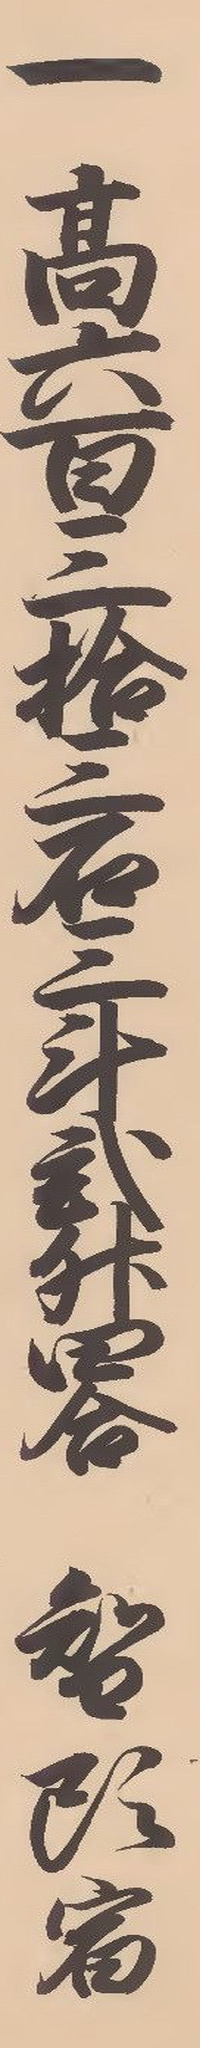一高六百三拾三石三斗弐升四合智頭宿
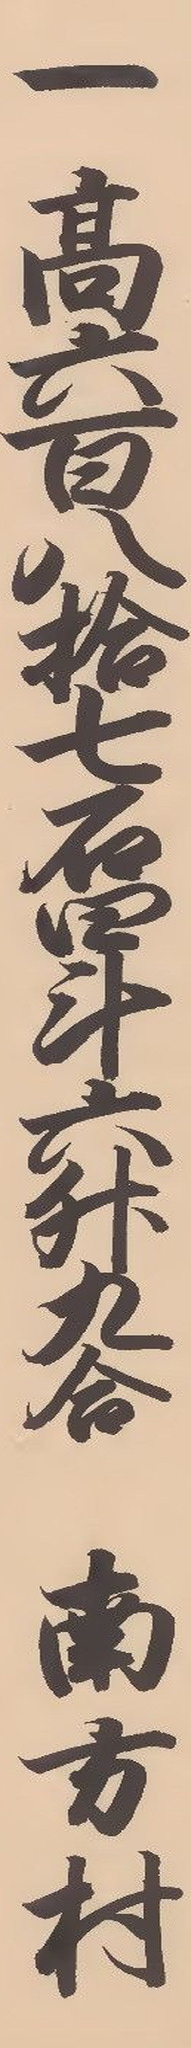一高六百八拾七石四斗六升九合南方村
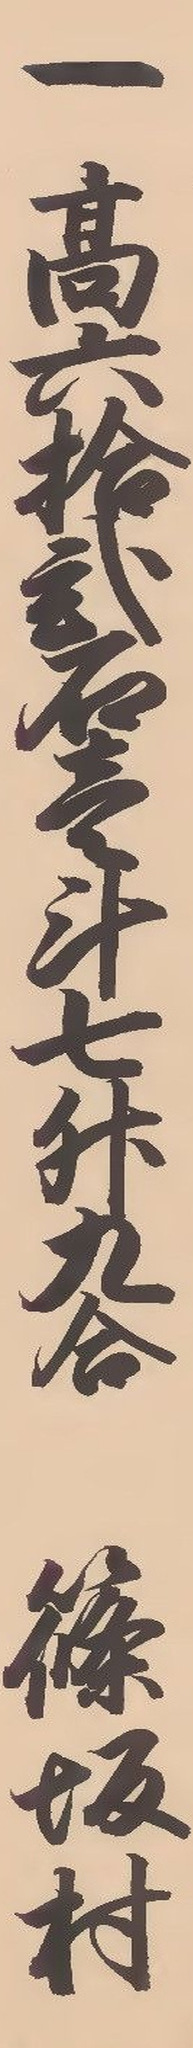一高六拾弐石壱斗七升九合篠坂村
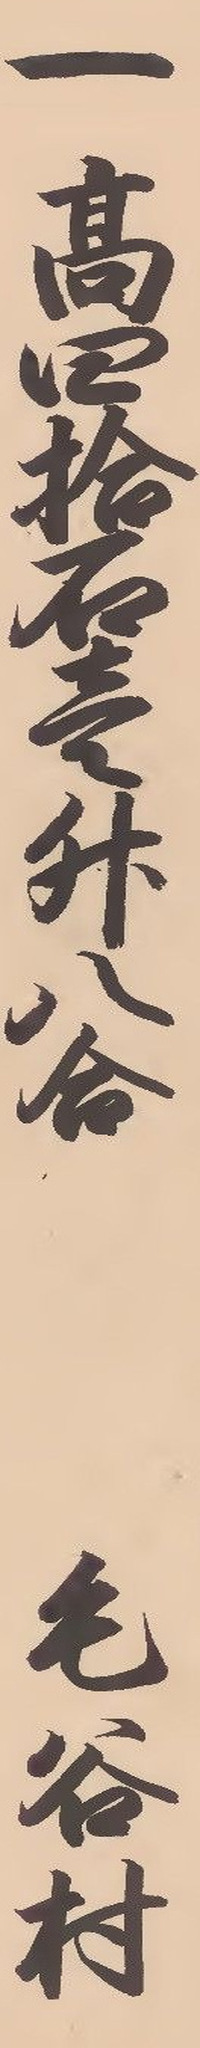一高四拾石壱升八合毛谷村
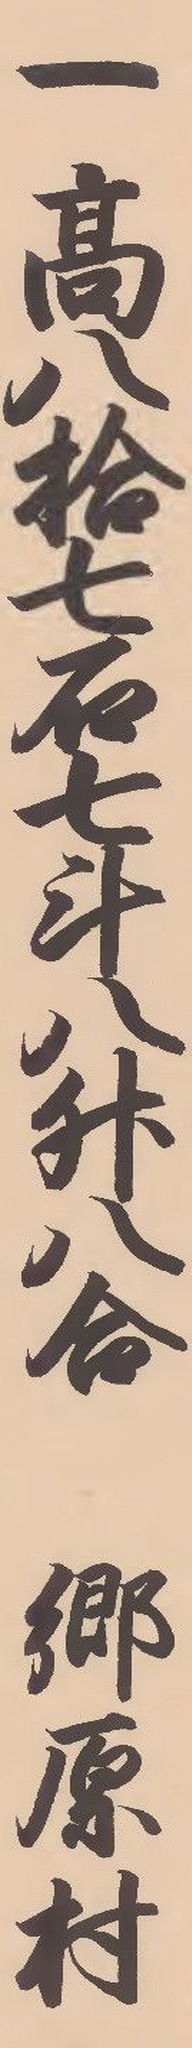一高八拾七石七斗八升八合郷原村
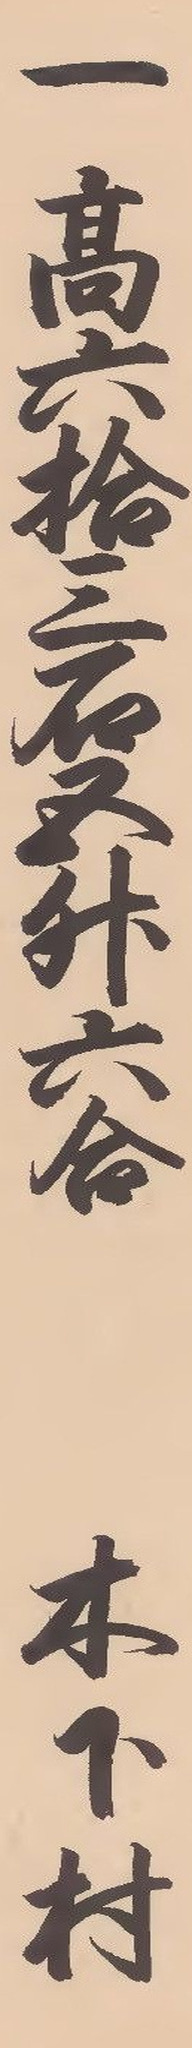一高六拾三石五升六合木下村
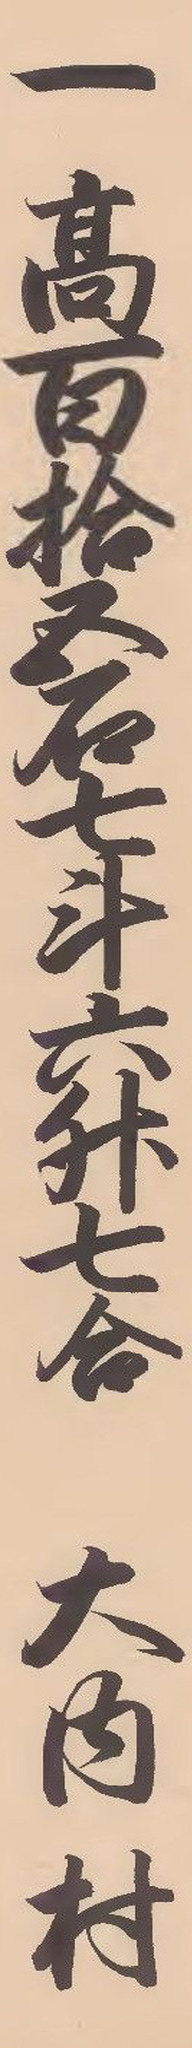一高百拾五石七斗六升七合大内村

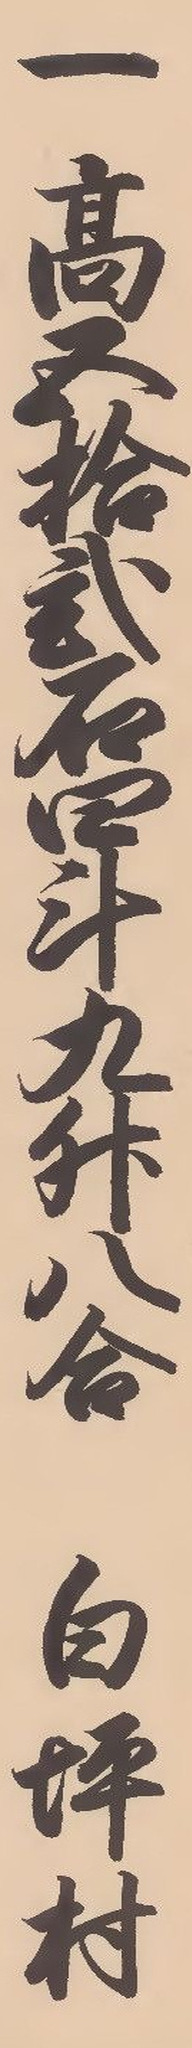一高五拾弐石四斗九升八合白坪村
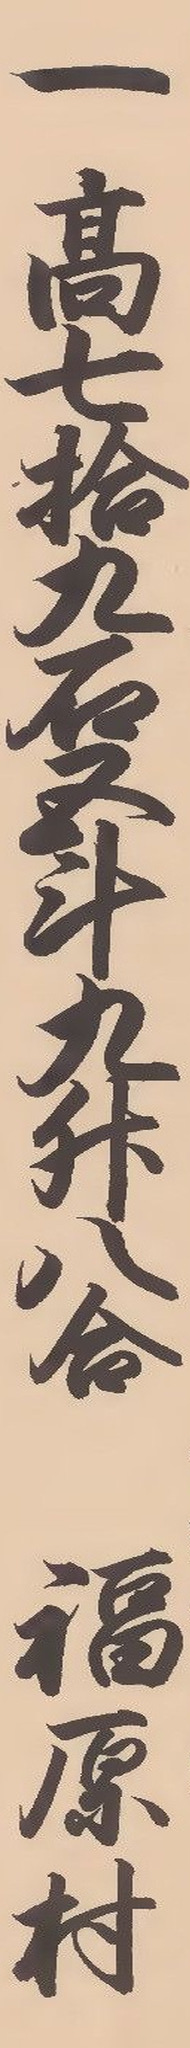一高七拾九石五斗七升六合駒帰村
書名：因幡国郷帳
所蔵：国立公文書館 National Archives of Japan
